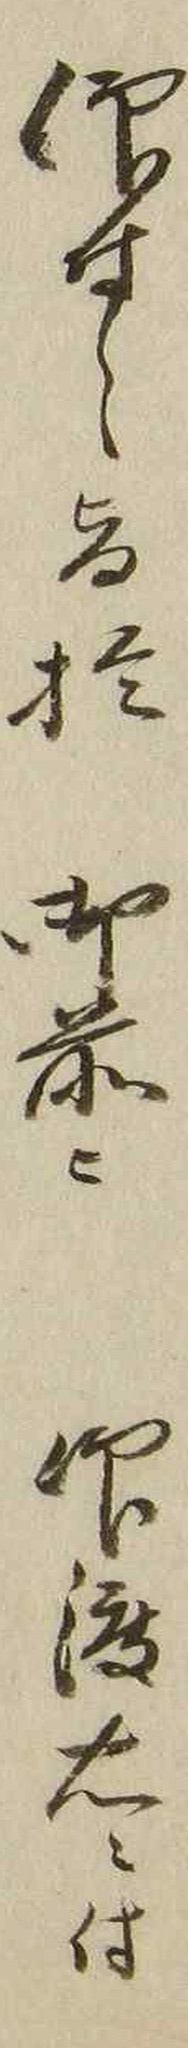仰付候旨於御前被仰渡右に付
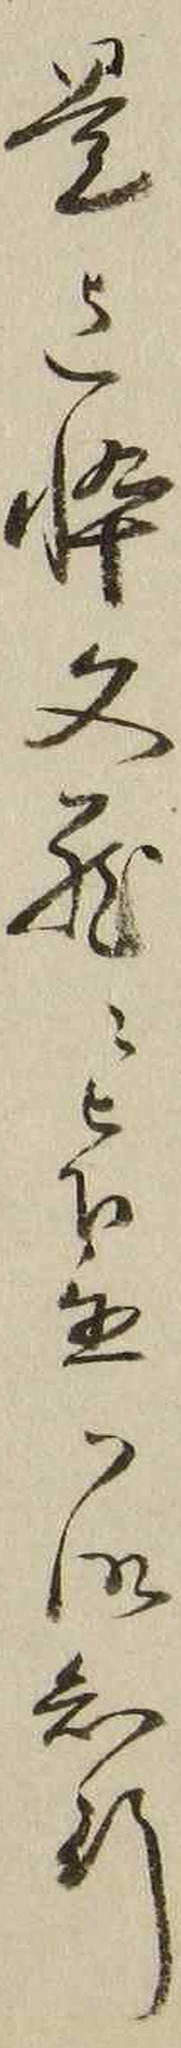是迄忰文蔵に被下置候御知行
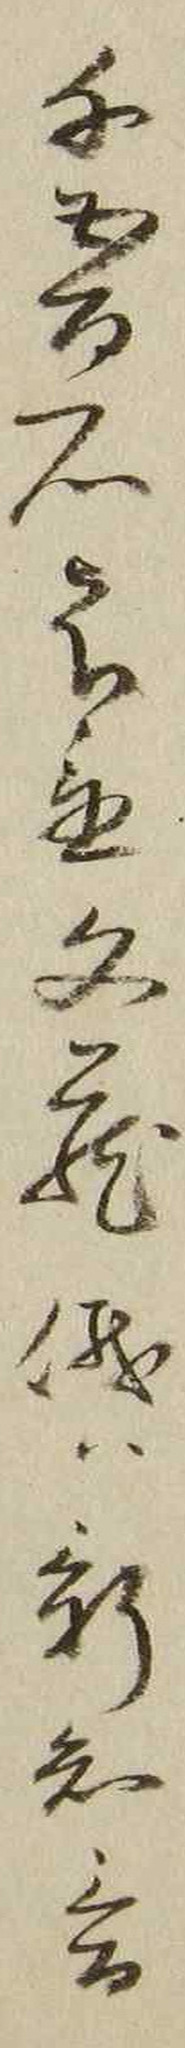千五百石被下置文蔵儀は新知三百
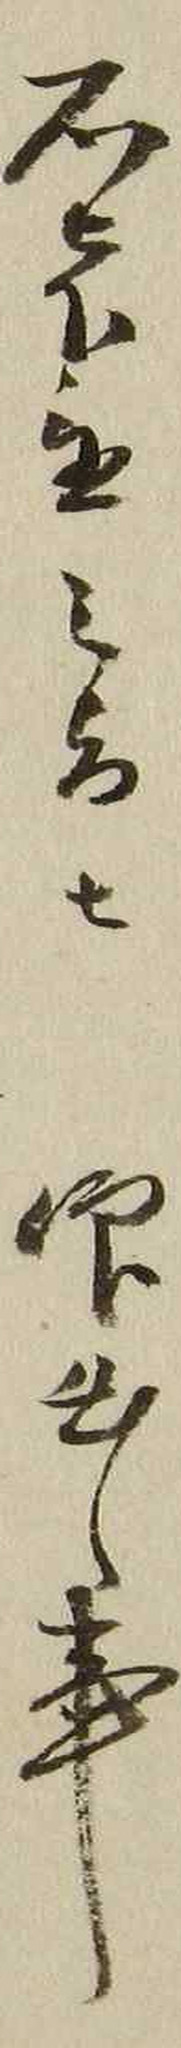石被下置之旨被仰出候事
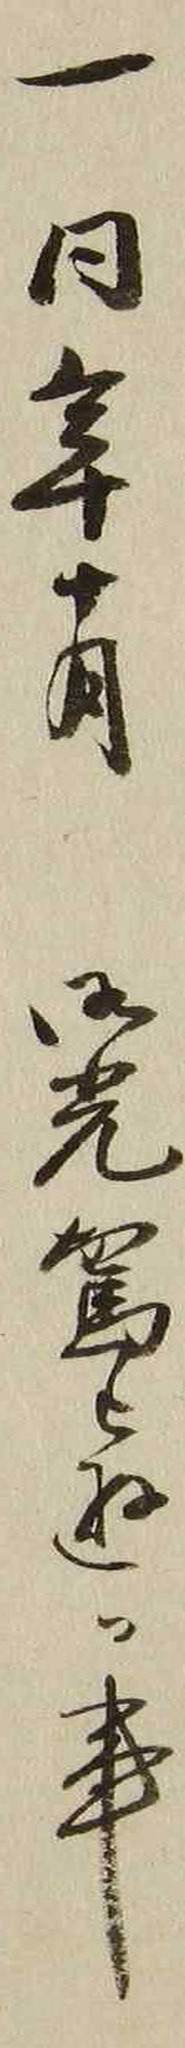一同年十月御光駕被遊候事
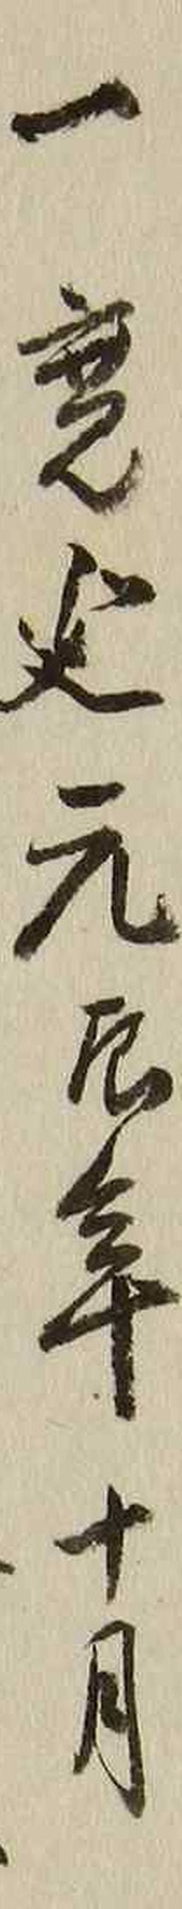一寛延元年辰年十月
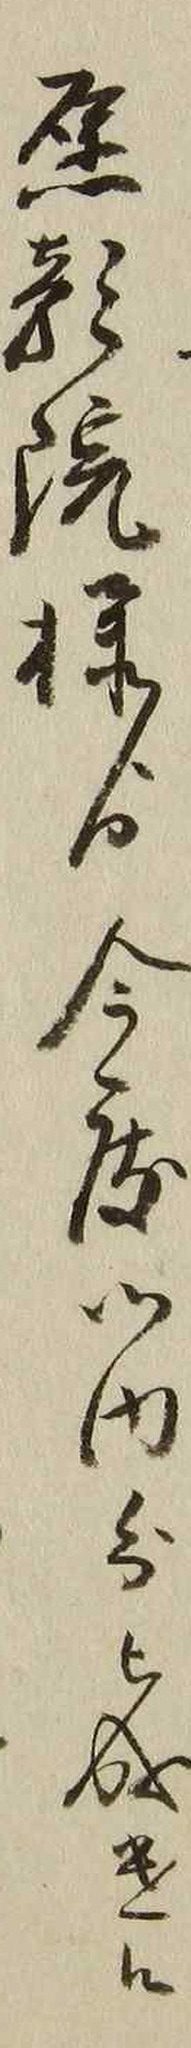愿顔院様ゟ今度御内分被成遣候
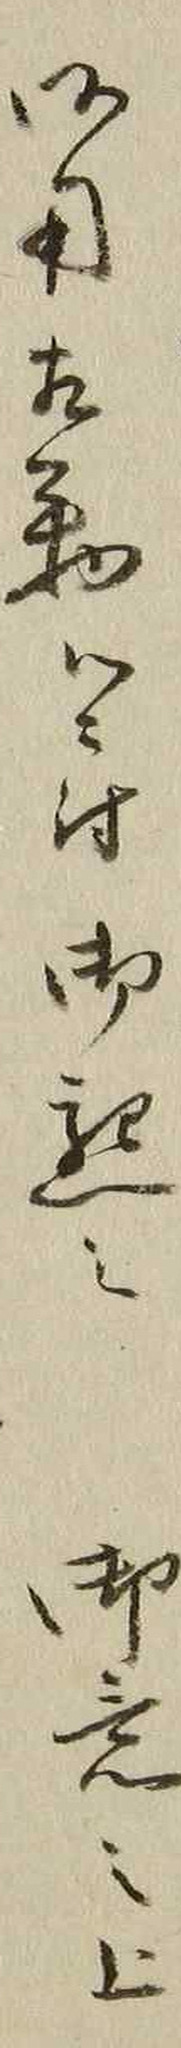御用相勤候に付御懇之御意之上
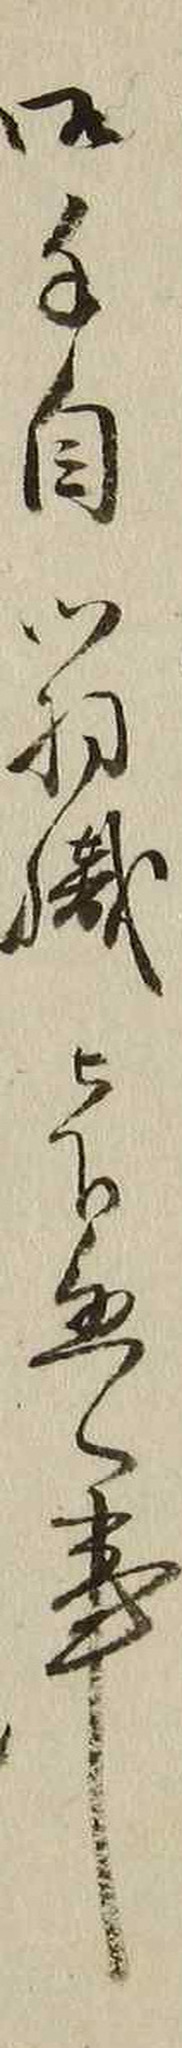御手自御羽織被下置候事
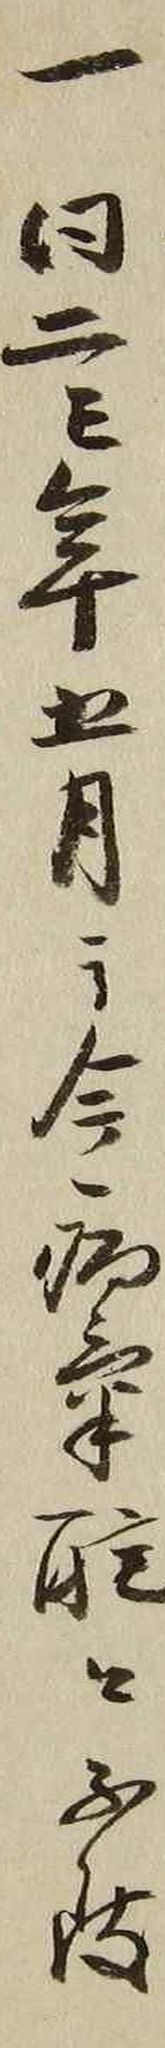一同二巳年五月示今病気聢と不致
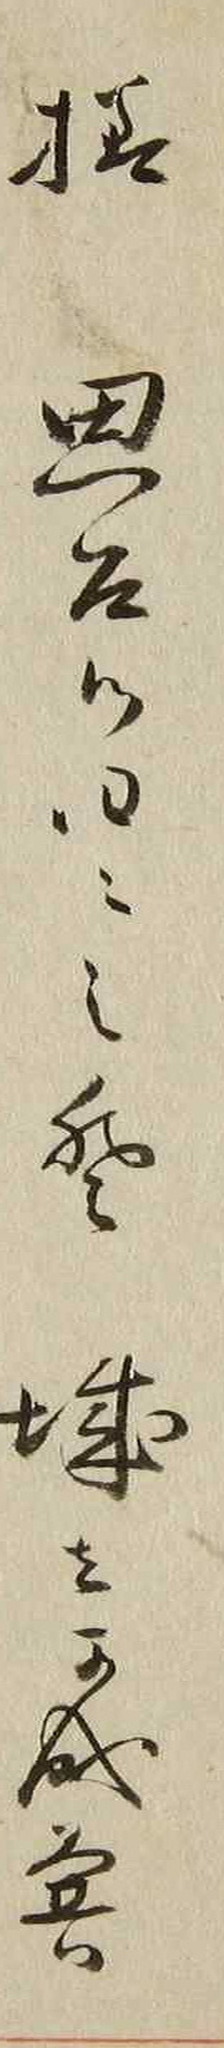様思召候内々之登城は相成兼候
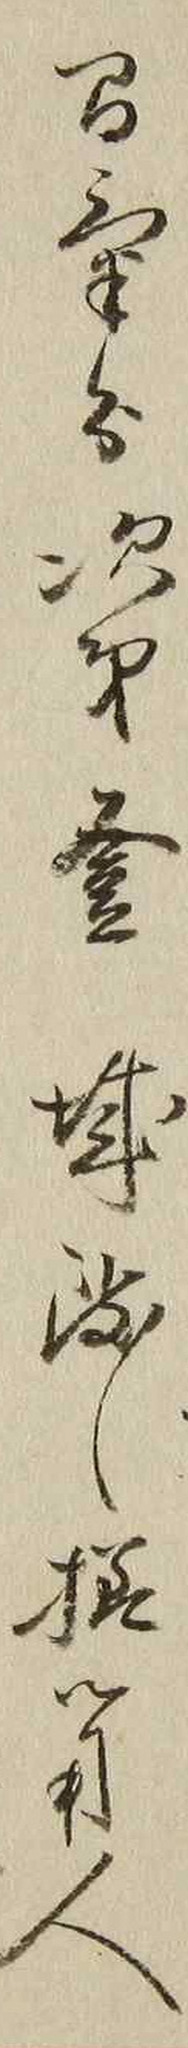間気分次第登城致候様御用人
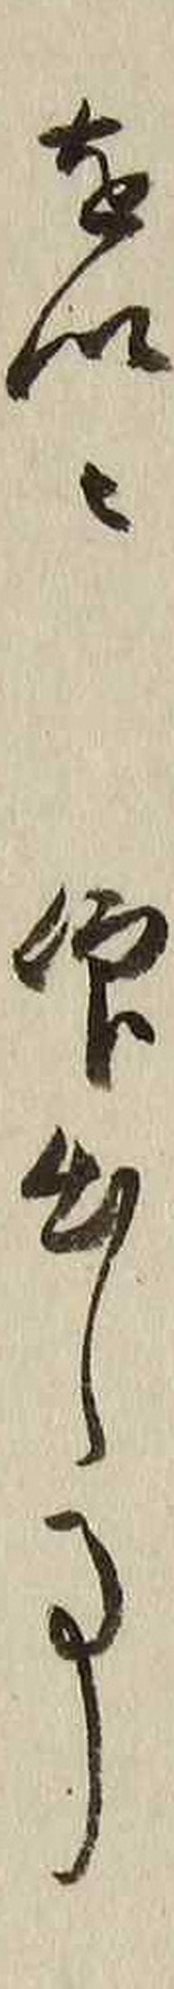を以被仰出候事
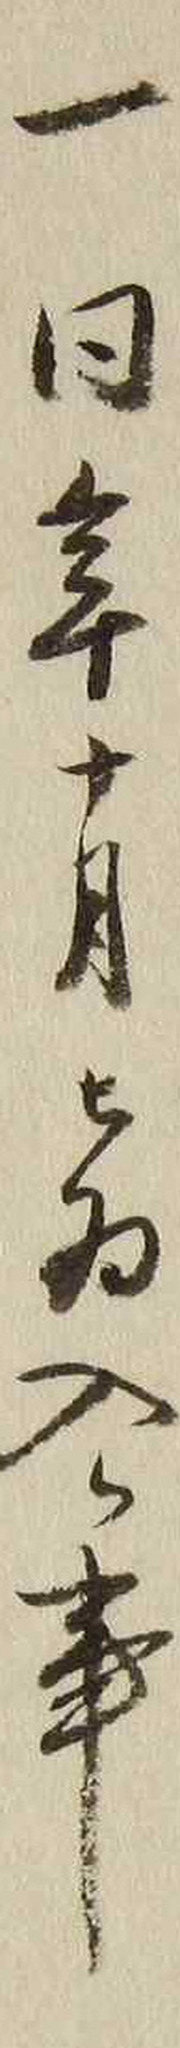一同年十月被為入候事
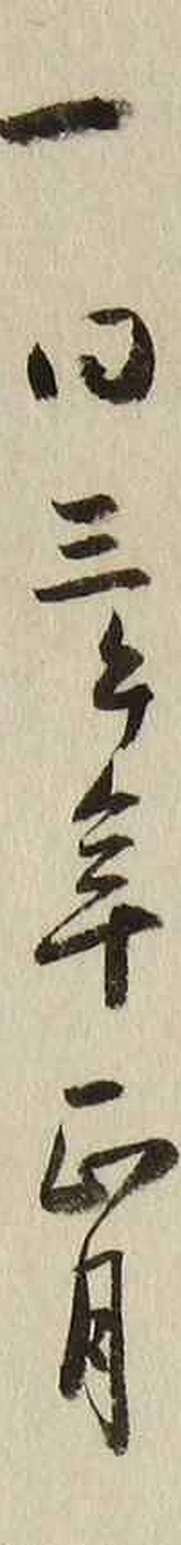一同三午年正月
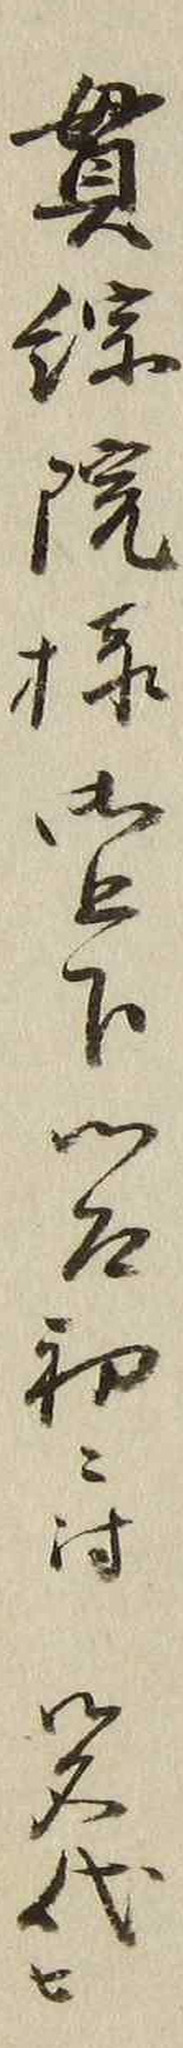貫綜院様御上下御召初に付御名代被
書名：諸士系譜　巻之269　さ之部1
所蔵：会津若松市立会津図書館
